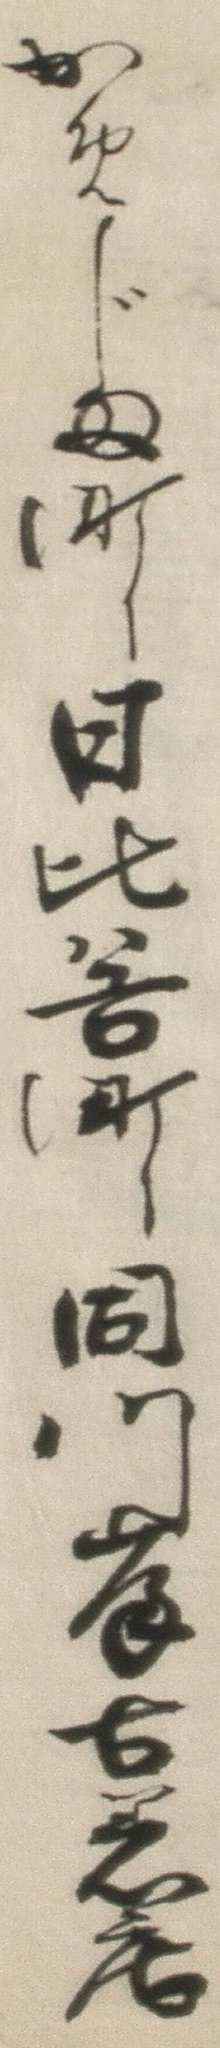かめじま町日比谷町同川岸古着店
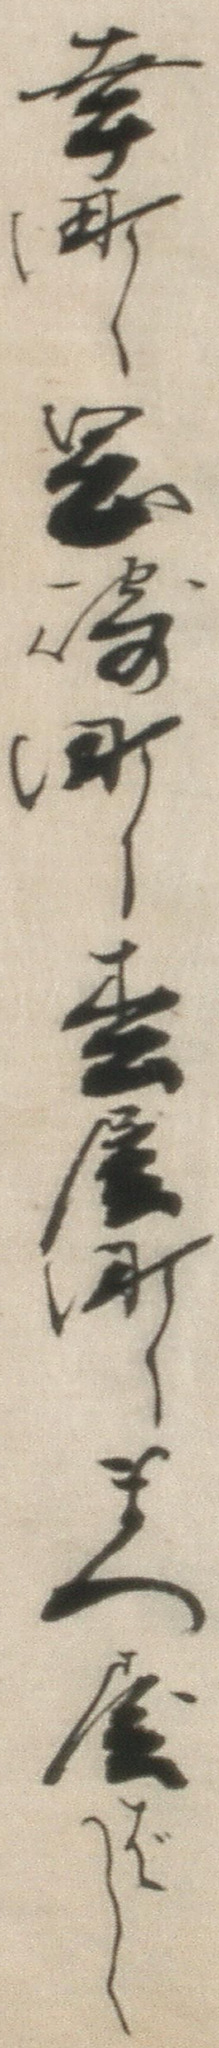幸町岡崎町松屋町まつ屋ばし
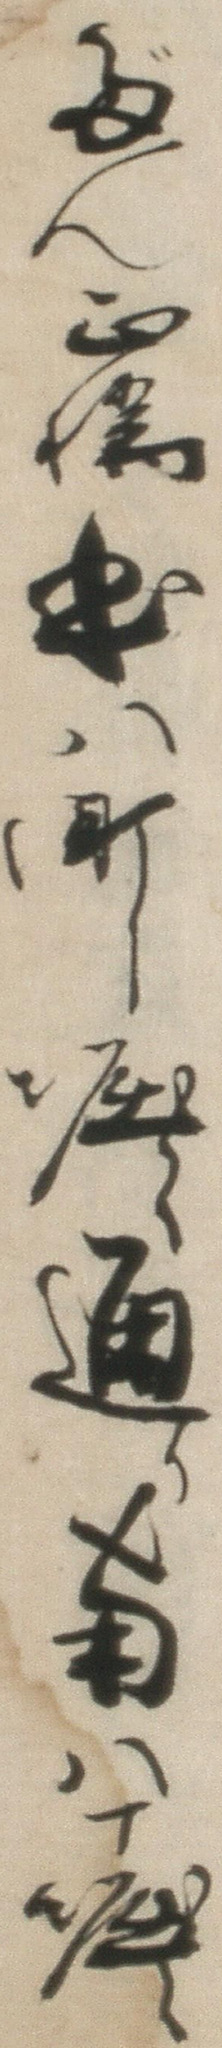だん正橋本八町堀通り南八丁堀
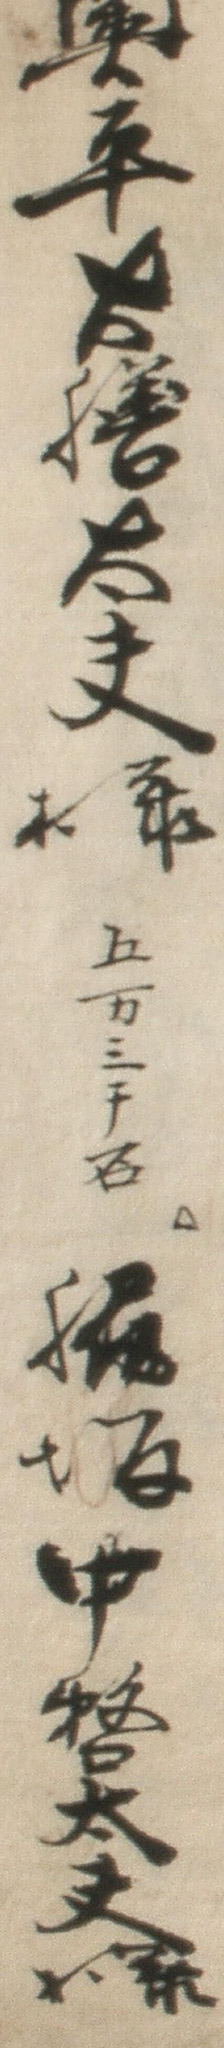△奥平大膳太夫様五万三千石△脇坂中務太夫様
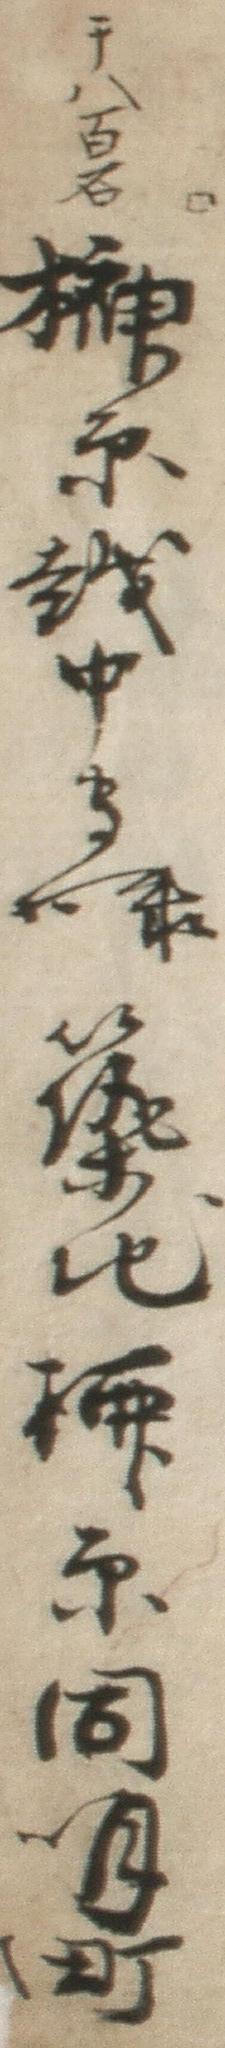千八百石▢榊原越中守様築地柳原同明町

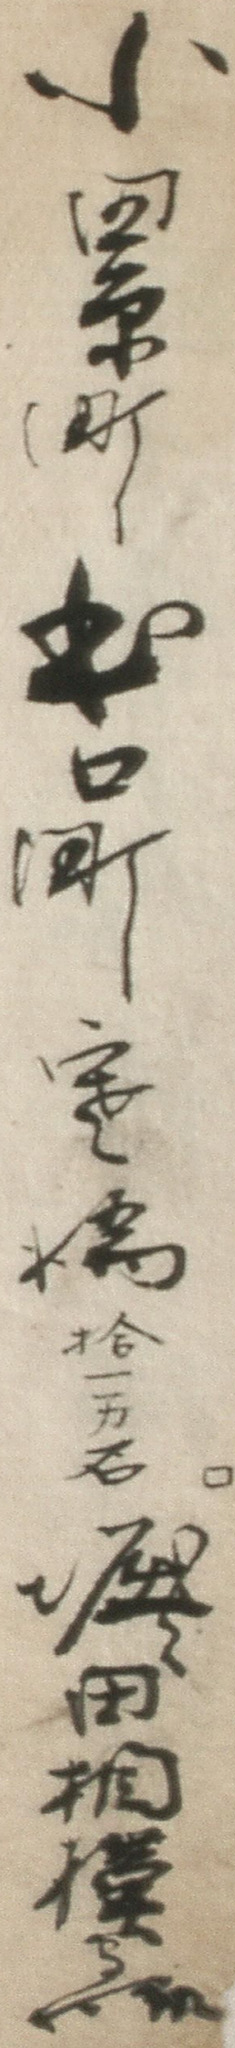小田原町本口町寒橋拾一万石▢堀田相模守様
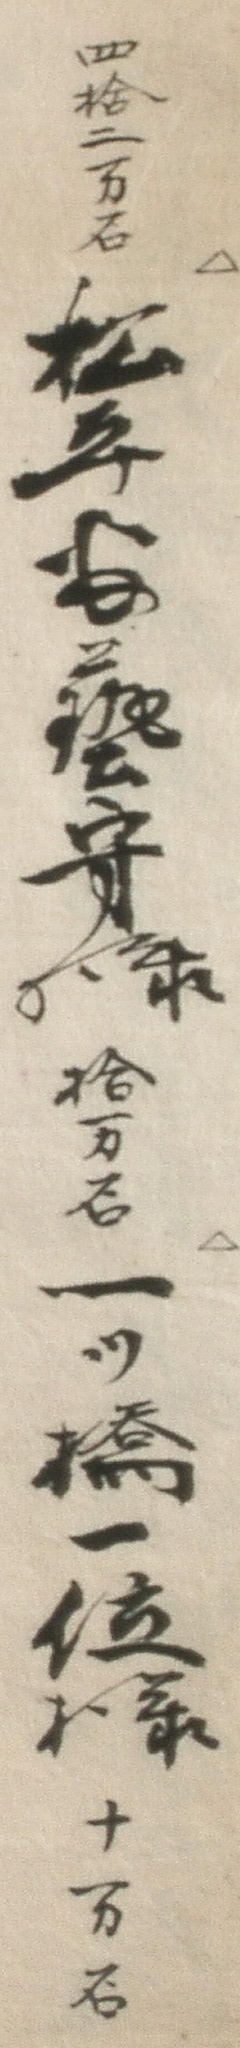四拾二万石△松平安芸守様拾万石△一ッ橋一位様十万石
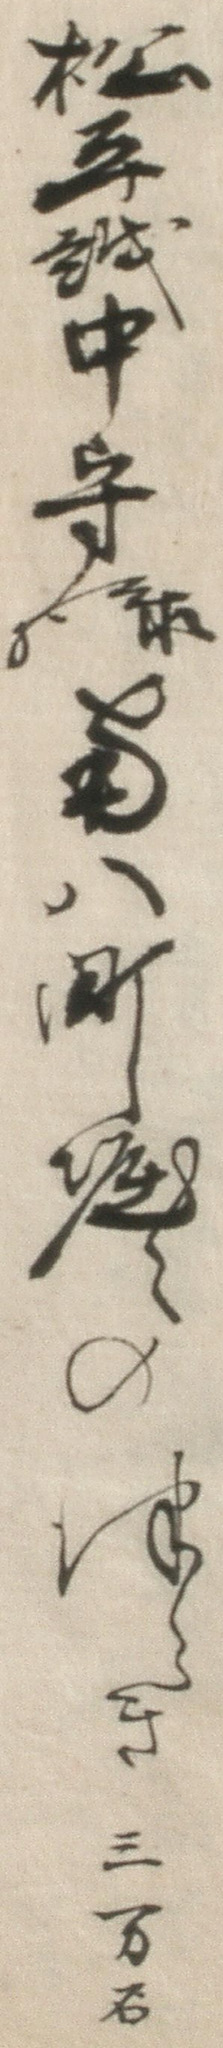△松平越中守様南八町堀のつゝき三万石
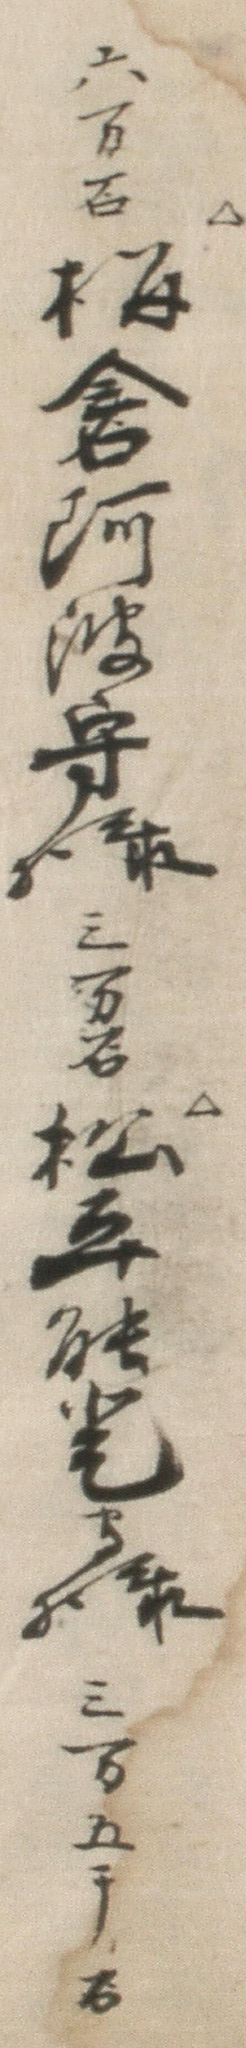六万石△板倉阿波守様三万石△松平能登守様三万五千石

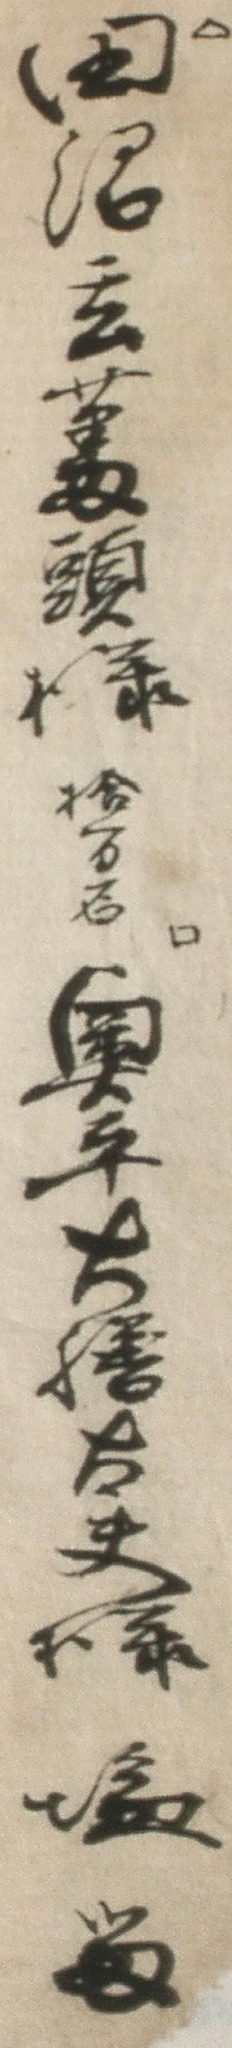△田沼玄蕃頭様拾万石▢奥平大膳太夫様塩留
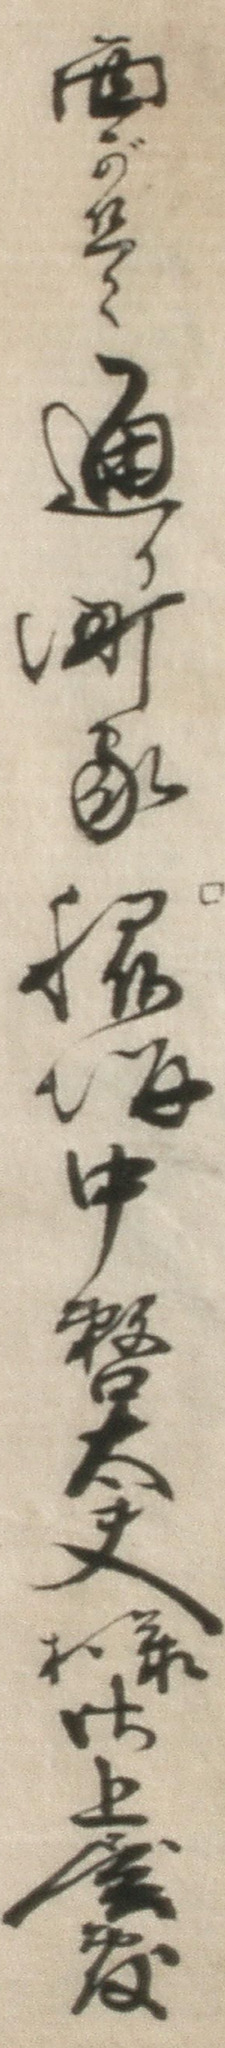西がは通り町家▢脇坂中務太夫様御上屋敷
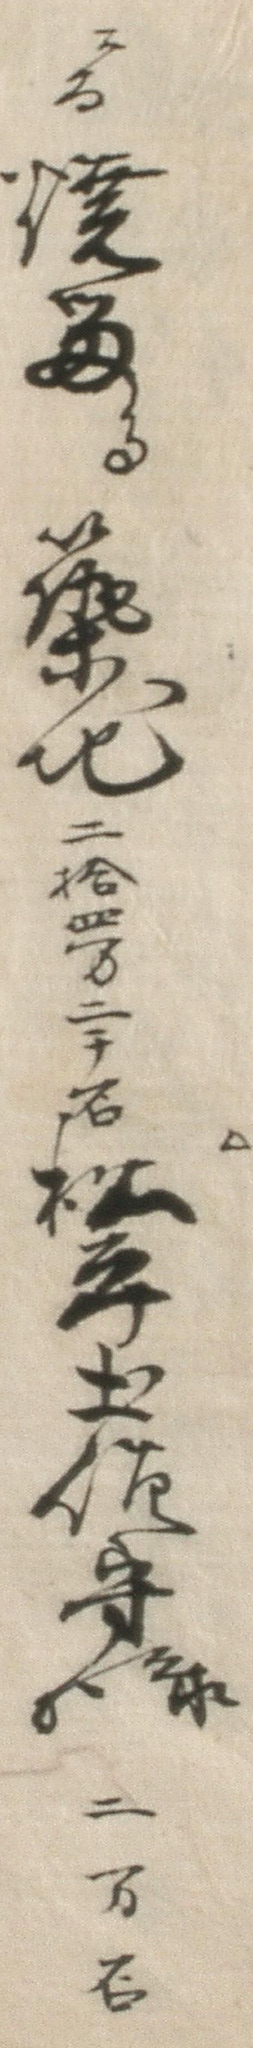二而焼留る築地二拾四万二千石△松平土佐守様二万石
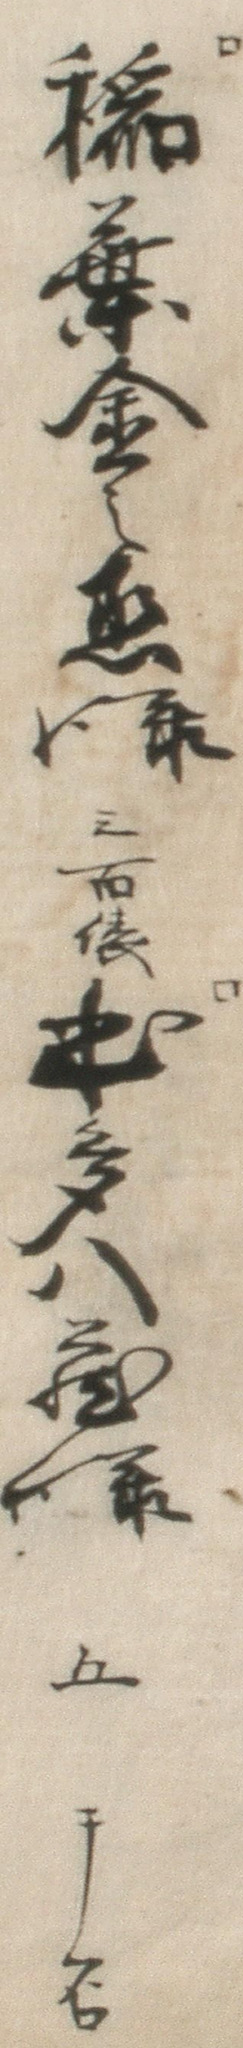▢稲葉金之丞様三百俵▢本多八蔵様五千石

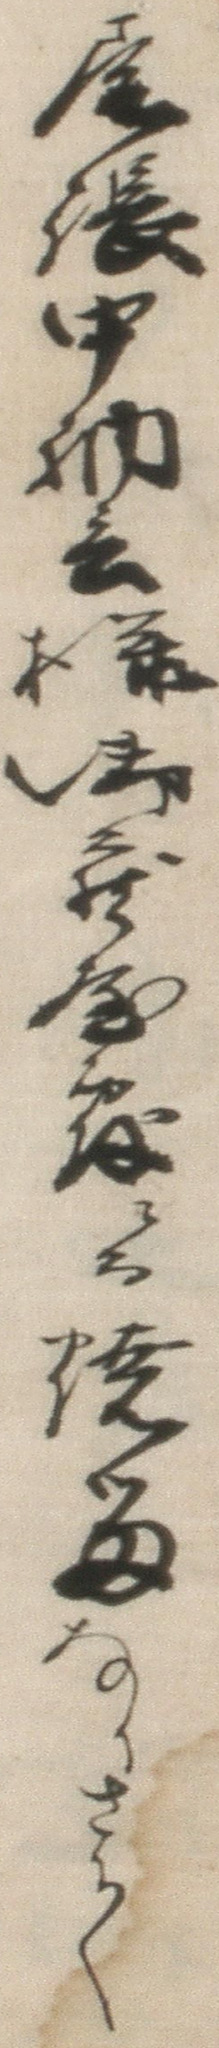△尾張中納言様御蔵屋敷二而焼留なりさて
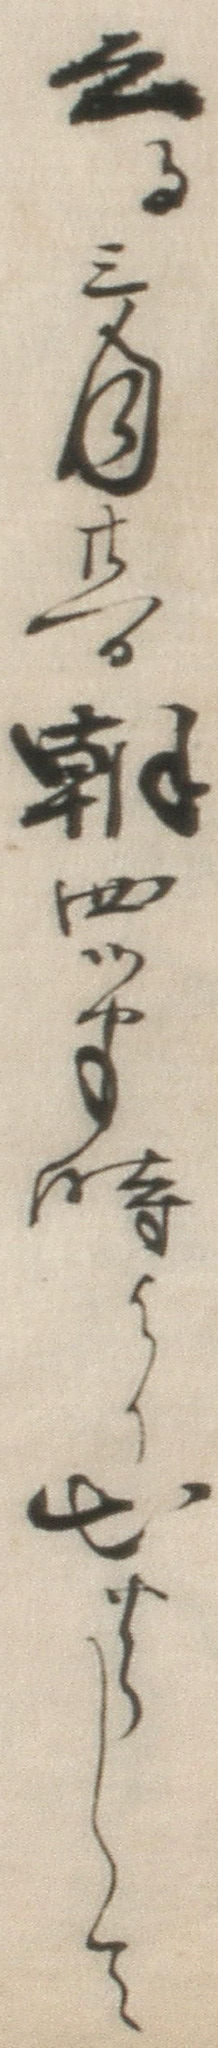去る三月廿一日朝四ッ半時より出火して
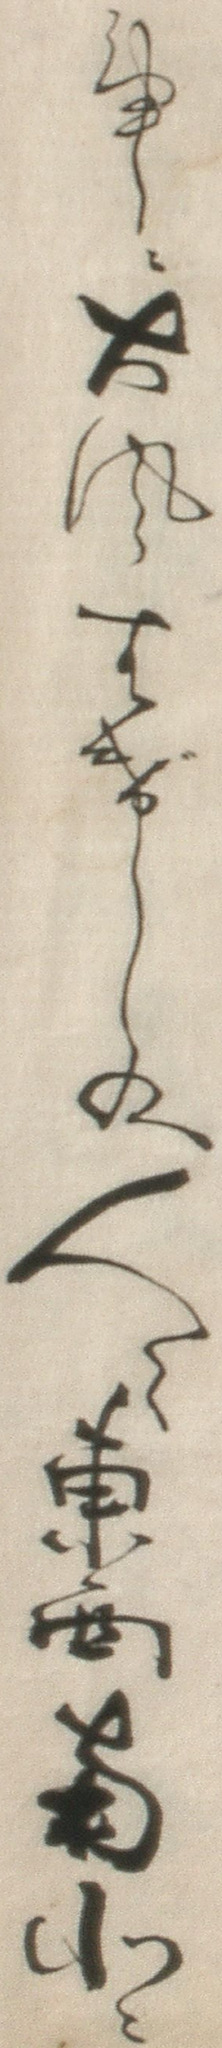事二大風はけしく人々東西南北二
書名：文政十二丑としの類焼場所附
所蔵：東京大学地震研究所図書室 Earthquake Research Institute Library, The University of Tokyo, JAPAN
